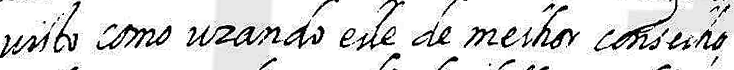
uisto como uzando elle de melhor conselho,
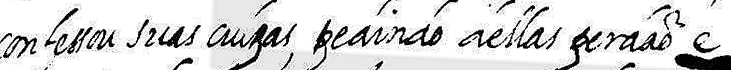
confessou suas culpas, pedindo dellas perdão e
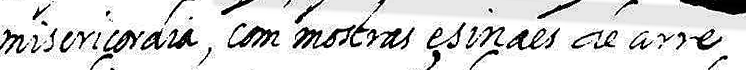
misericordia, com mostras e sinaes de arre
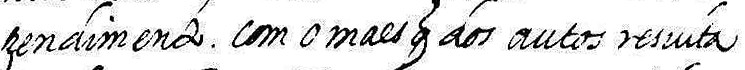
pendimento com o maes q̄ dos autos resulta
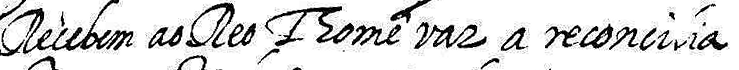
Recebem o Reo Thomé vaz, a reconcilia
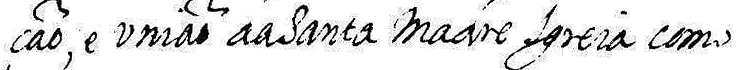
çaõ e uniaõ da Santa Madre Igreia como
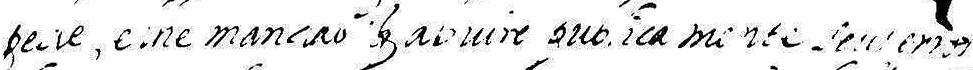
pede, e lhe mandão q̄ abiure publicamente seus erros
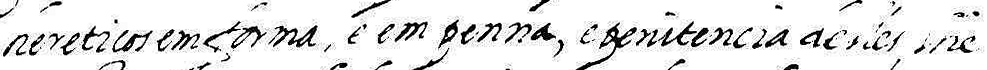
hereticos em forma, e em penna, e penitencia delles, lhe
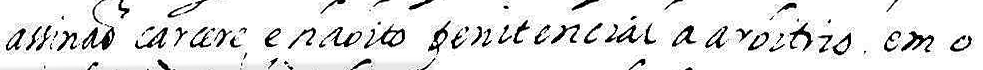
assinaõ carcere e habito penitencial a arbitrio em o
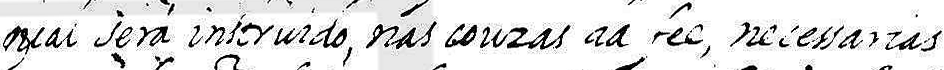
qual sera instruido, nas couzas da fee, necessarias
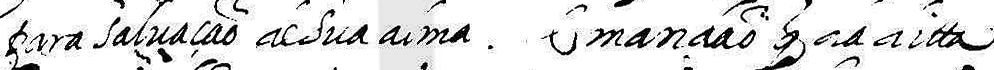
para saluação de sua alma. E mandão q̄ da ditta
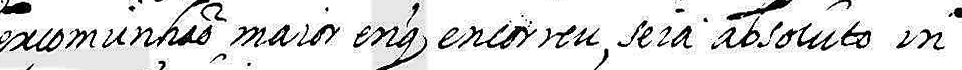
excomunhão maior en q̄ encorreu, seia absoluto in
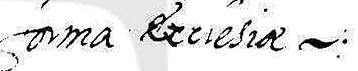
forma ecclesiae.
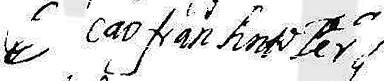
aõ fran Pinto Per.ã
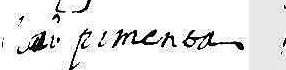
pimenta
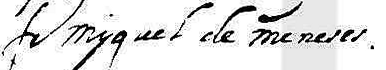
fr miguel de meneses
